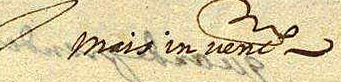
mais inuentro
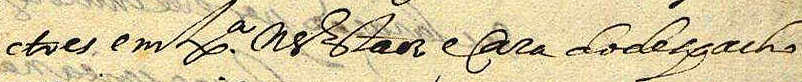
e tres em Lx.a nos estaos e Caza do despacho
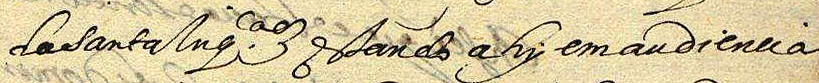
da santa Inq.caõ, estando ahy em audiencia
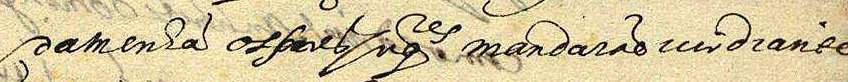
da menhã os snres̄ Jnqres mandaraõ uir diante
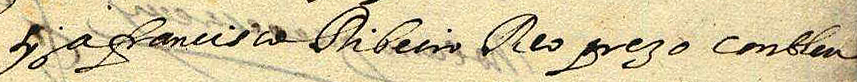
sy, a francisco Ribeiro Reo prezo contheu
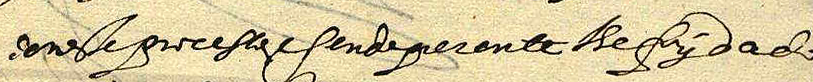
do neste processo e sendo prezente lhe foy dado
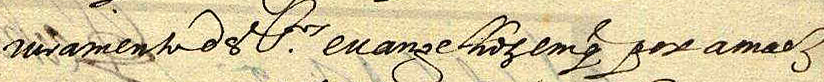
iuramento dos s.tos euangelhos em q̄ pos a maõ
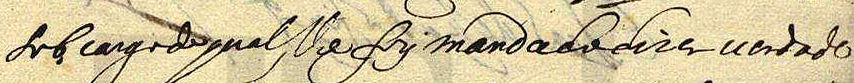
sob cargo do qual, lhe foy mandado dizer uerdade,
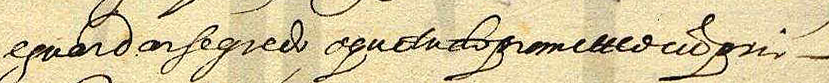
e guardar segredo, o que tudo prometteo cūprir
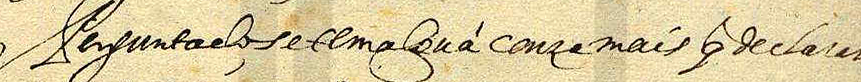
Perguntado, se tem alguā couza mais pa declarar
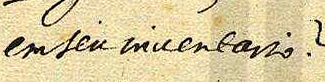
em seu inuentario?
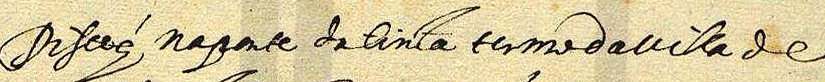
Disse q̄ na ponte da tinta termo da uilla de
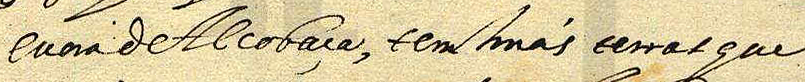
euora de Alcobaça, tem huas̄ terras que
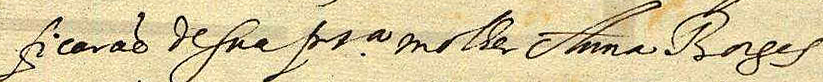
ficaraõ de sua pr.a molher Anna Borges
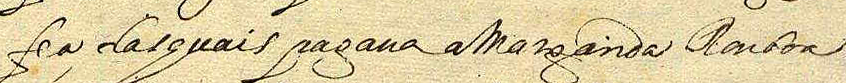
fea, das quais pagaua a Margarida Rouboa
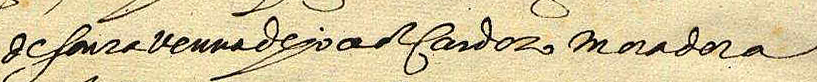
de souza veuua de joaõ Cardozo moradora
